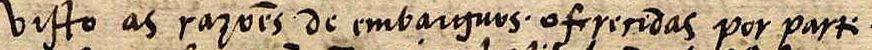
visto as razões de embarguos. oferecidas por parte
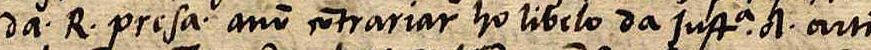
da. R. presa. a nō con̄trariar o libelo da Justa. A. arti
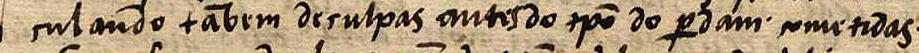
culando tābem desculpas antes do tpō do ꝑdam. cometidas.
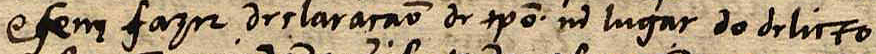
e sem fazer declaraçaõ de tpō. nē lugar do delicto.
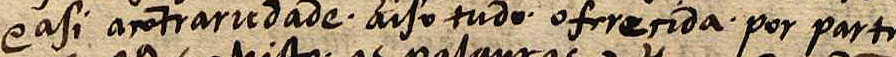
e asi cōtrariedade. a iso tudo. oferecida. por parte
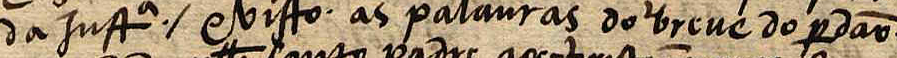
da Justa. / e visto- as palauras do breue do ꝑdão.
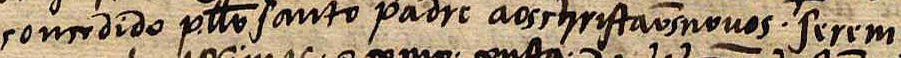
concedido pl̄lo santo padre aos christaõs nouos. serem.
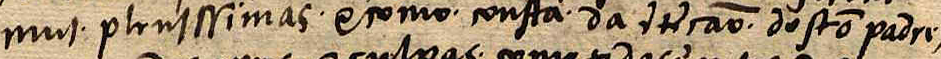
muj. plenjssimas. e como. consta. da ētēção. do stō padre/
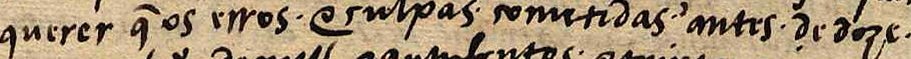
querer q̄ os erros. e culpas. cometidas. antes. de doze.
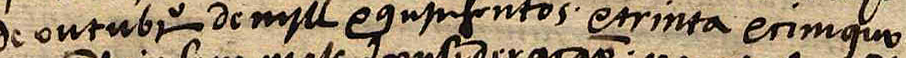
de outubro de mjll e qujnhentos. e trinta e cimquo
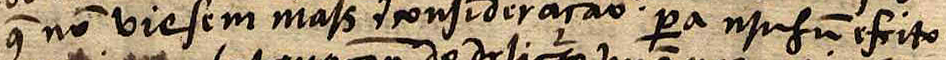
q̄ nō viesem majs ē consideraçaõ. ꝑa njnhū efeito
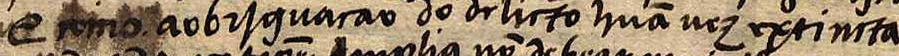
e como a obrjguacão do delicto huā uez extincta
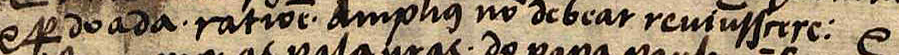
e ꝑdoada. ratiōe. ampliꝯ nō debeat reuiujsere: e
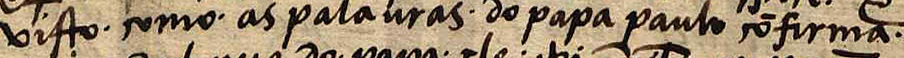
visto. como. as palauras. do papa paulo cōfirma.
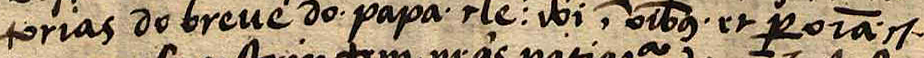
torias do breue do. papa. ele: ibi ī oībꝯ. et ꝑ oīa. el.
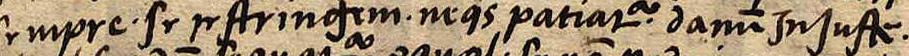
sempre. se restringem. neqis patiatur danū Jn Juste.
